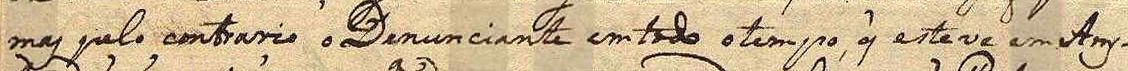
mas pelo contrario o Denunciante em todo o tempo, q̄ esteve em Ams
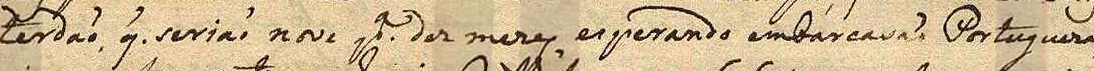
terdaõ, q̄ seriaõ nove p.a dez mezes, esperando embarcasaõ Portugueza
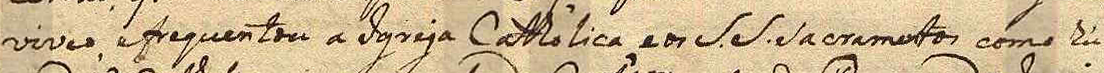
viveo, e frequentou a Igreja Catholica, e os S.S. Sacramentos como hū
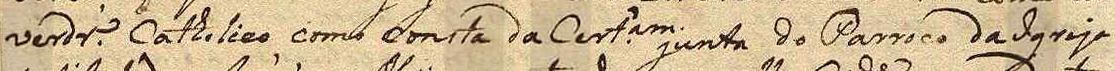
verdr.o Catholico, como consta da Cert.am junta do Parroco da Igreja
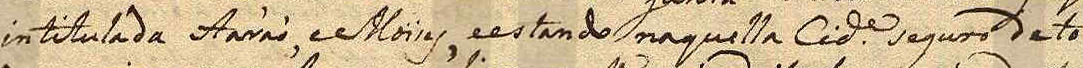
intitulada Aaraõ e Moises, e estando naquella Cid.e seguro de to
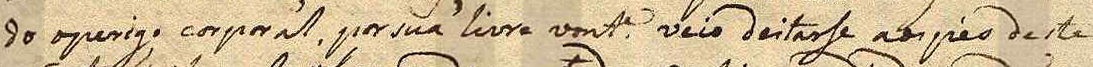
do o perigo corporal, por sua livre vont.e veio deitarse aos pés deste
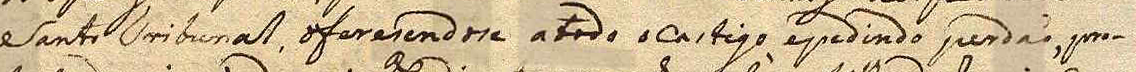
Santo Tribunal, oferesendose a todo o castigo, e pedindo perdaõ, pro
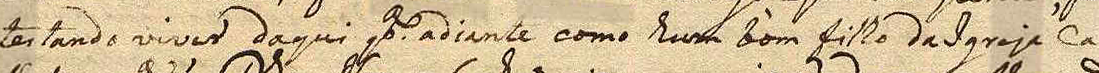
testando viver daqui p.a adiante como hum bom filho da Igreja Ca
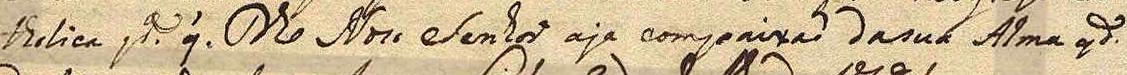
tholica p.a q̄ D̄ Noso Senhor aja com paixaõ da sua Alma qd.o
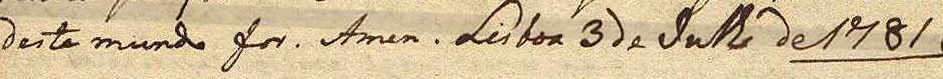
deste mundo for. Amen. Lisboa 3 de Iulho de 1781
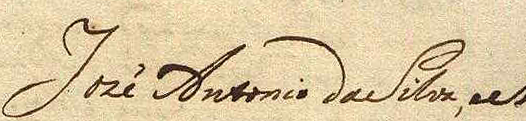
Jozé Antonio da Silva, e
